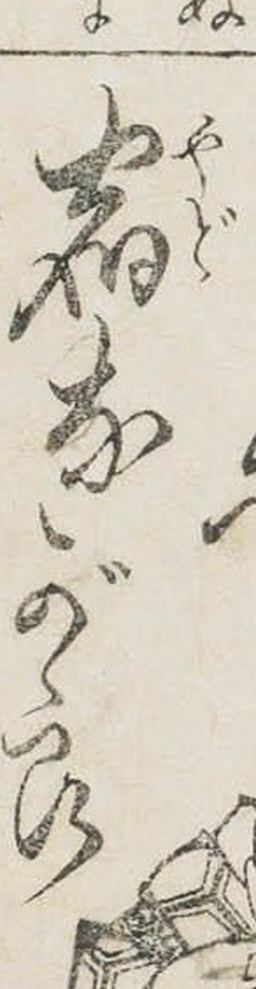宿ながら
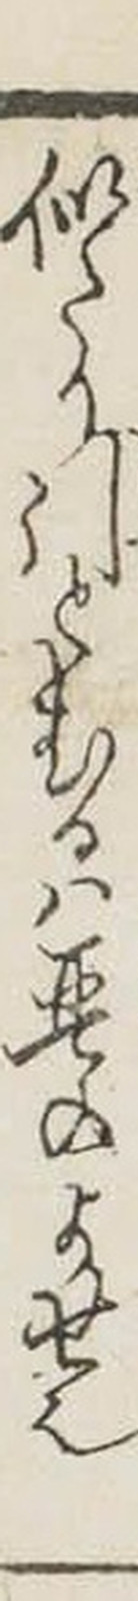似たり引とむるは琴のよせ也
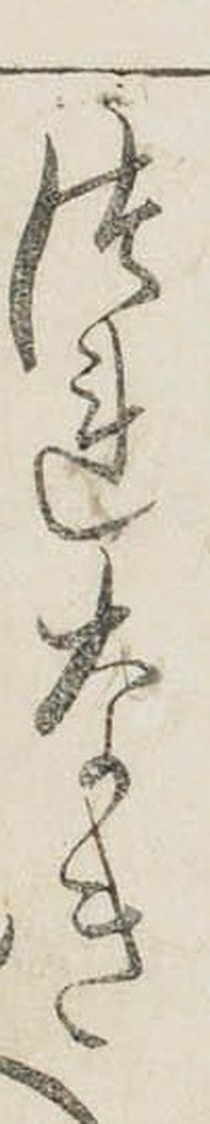つれなき
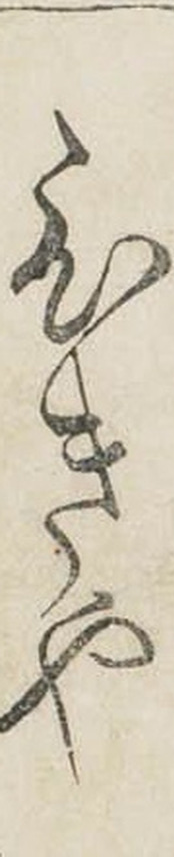ひきや
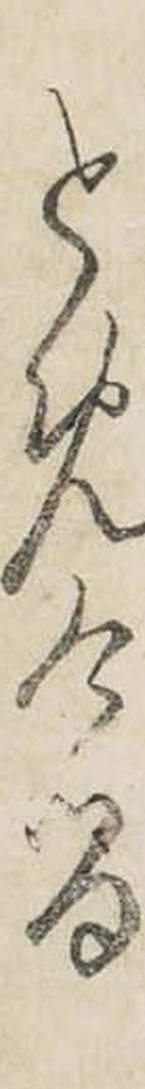とめける

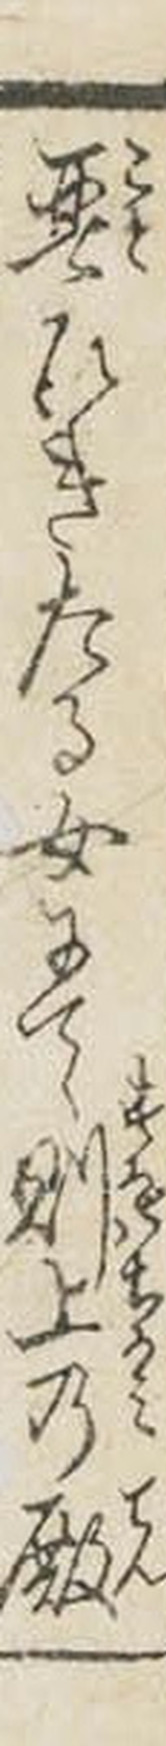琴ひきたる女にて則上の殿
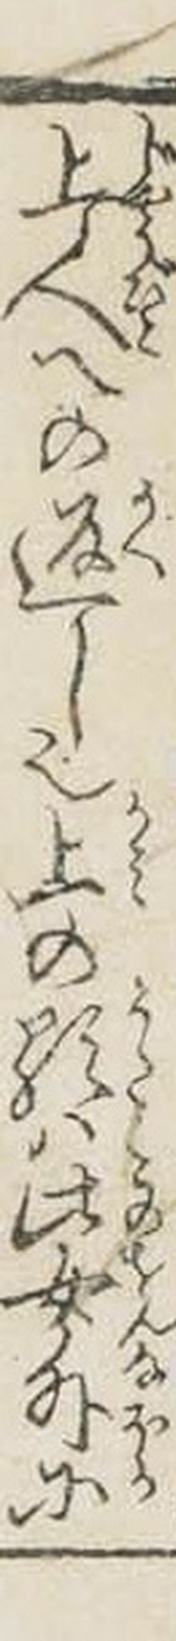上人への返し也上の歌は此女外に
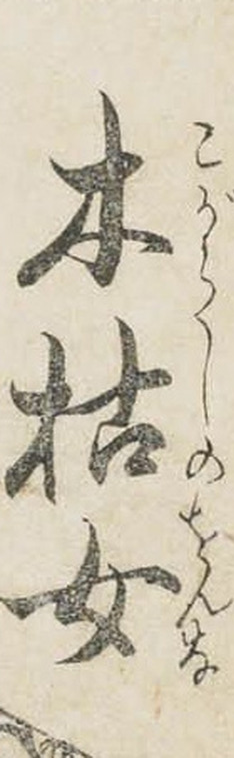木枯女
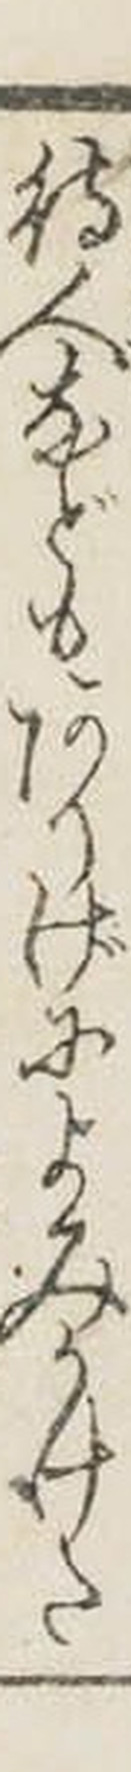待人などもありげによみかけた
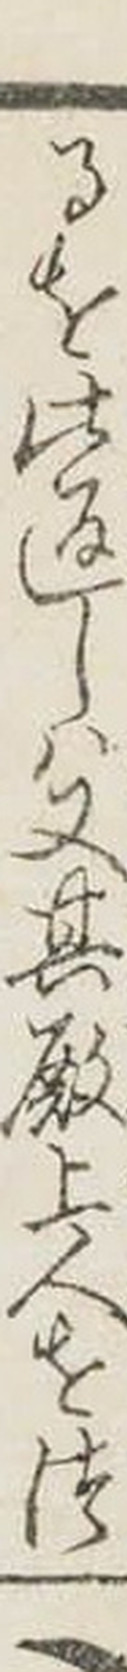るを此返しは又其殿上人をつ
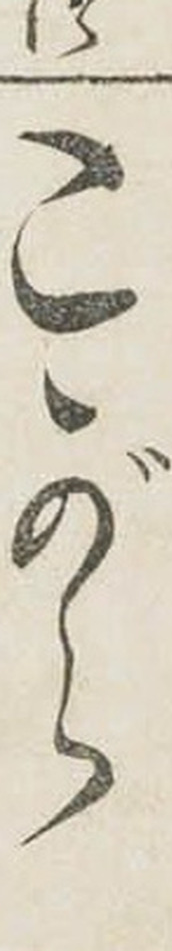こがら
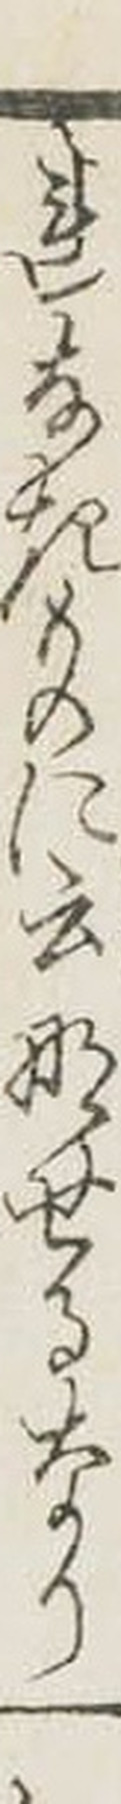れなきものに云なせるなり
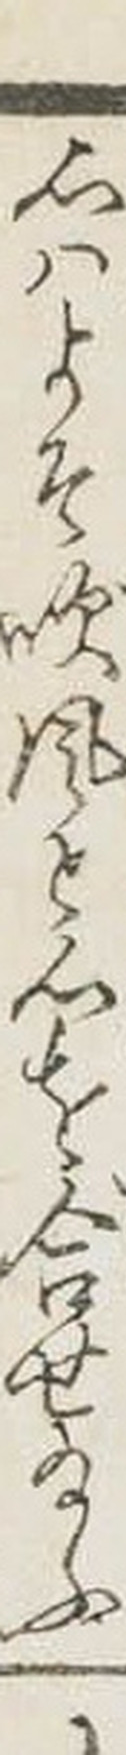心はよそ吹風と心を合せ給ふ
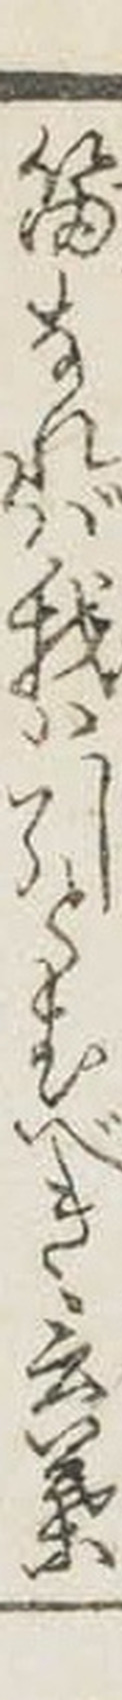笛なれば我は引とむべき言葉
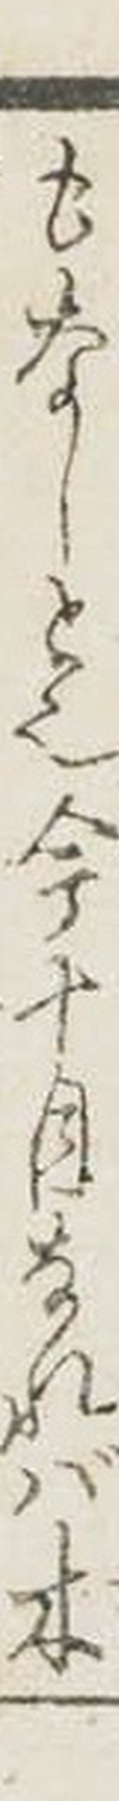もなしと也今十月なれば木
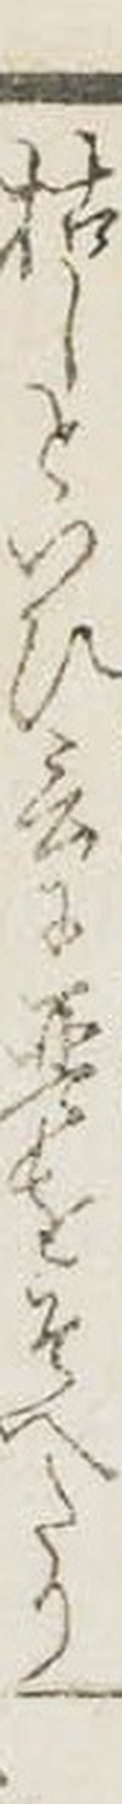枯しといひ言に琴をそへたり
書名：源氏百人一首
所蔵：東京学芸大学教育コンテンツアーカイブ
